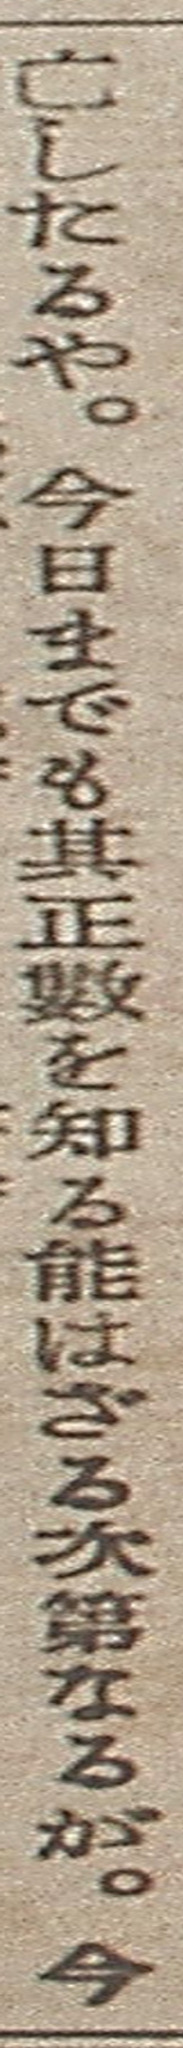亡したるや。今日までも其正数を知る能はざる次第なるが。今
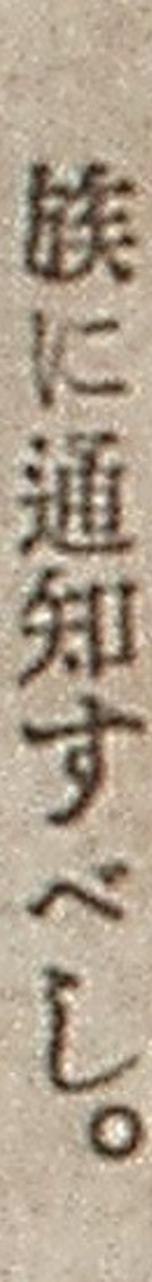族に通知すべし。
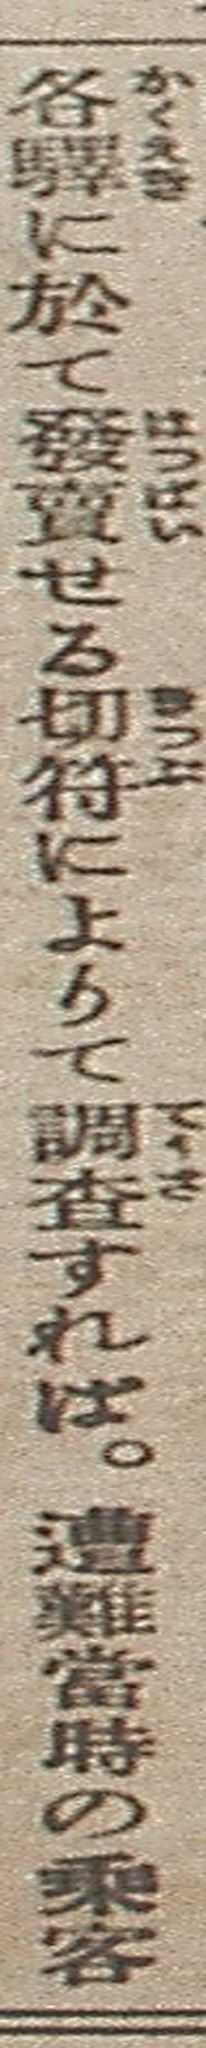各駅に於て発売せる切符によりて調査すれば。遭難当時の乗客
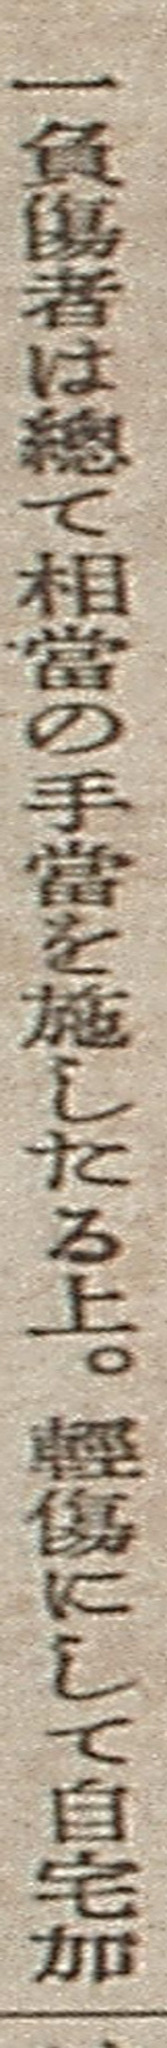一負傷者は総て相当の手当を施したる上。軽症にして自宅加
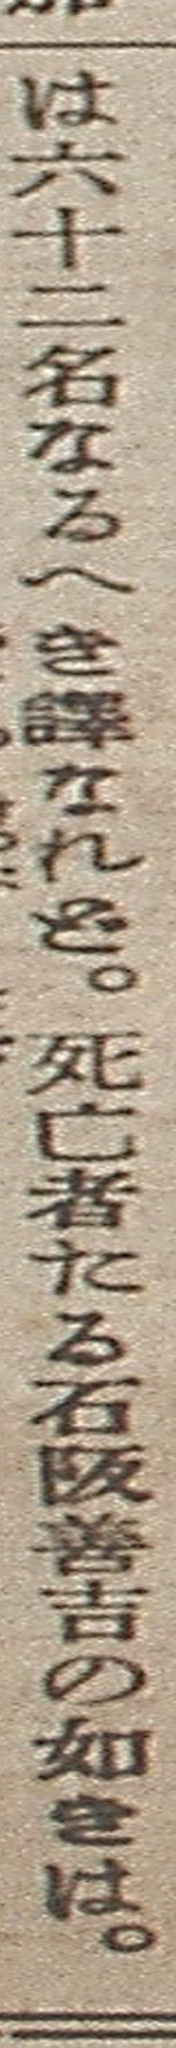は六十二名なるへき訳なれど。死亡者たる石坂善吉の如きは。
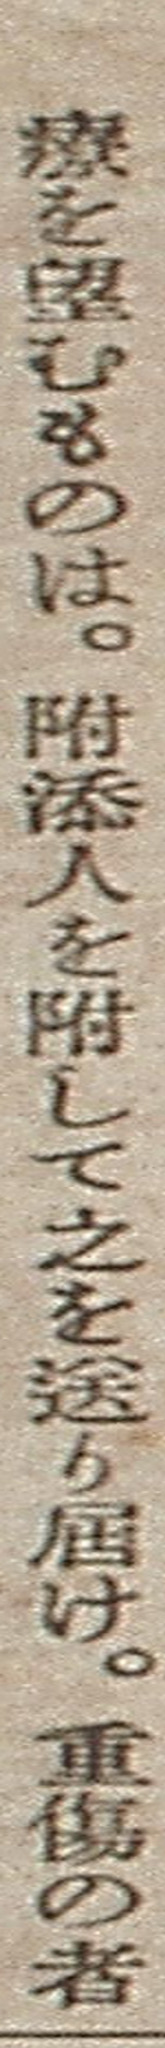療を望むものは。付添人を付して之を送り届け。重症の者
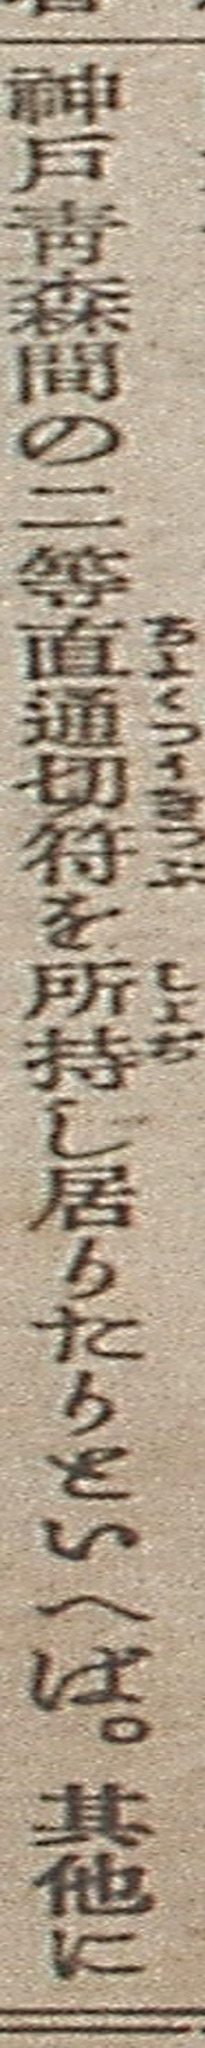神戸青森間の二等直通切符を所持し居りたりといへば。其他に
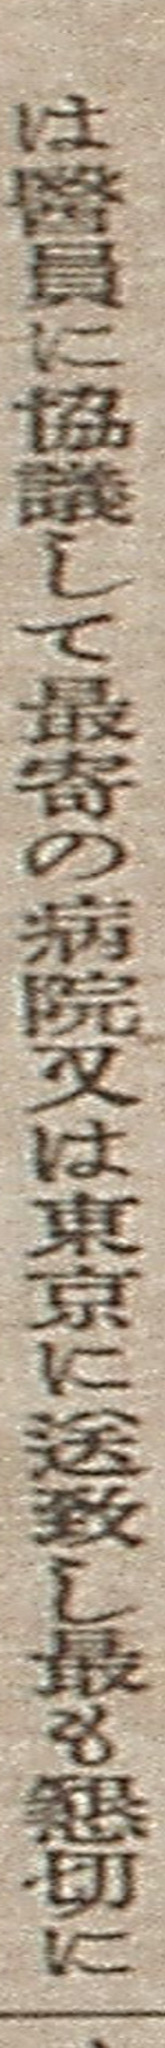は医員に協議して最寄の病院又は東京に送致し最も懇切に
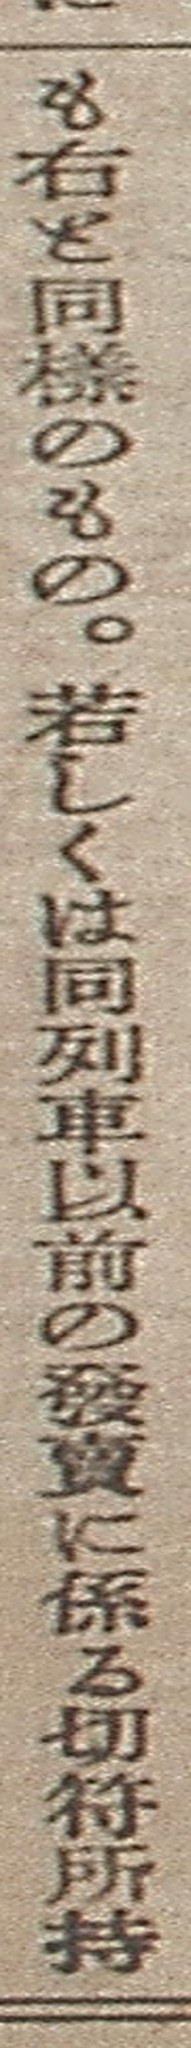も右と同様のもの。若しくは同列車以前の発売に係る切符所持

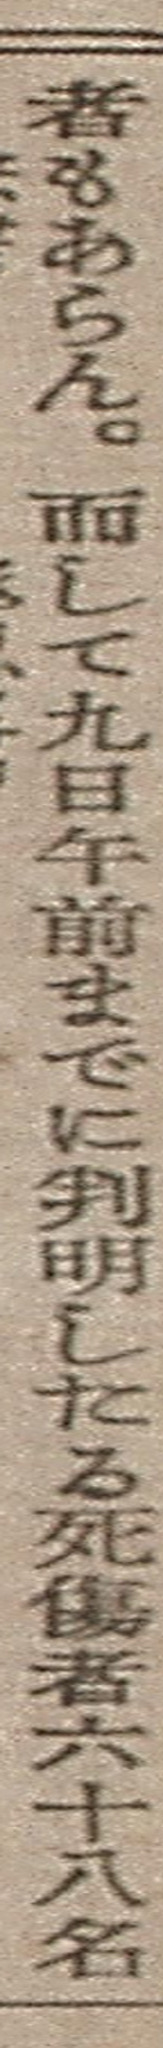者もあらん。而して九日午前までに判明したる死傷者六十八名
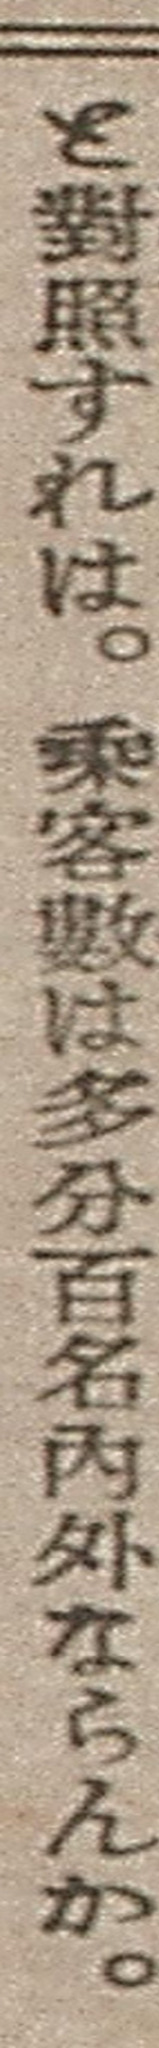と対照すれは。乗客数は多分百名内外ならんか。
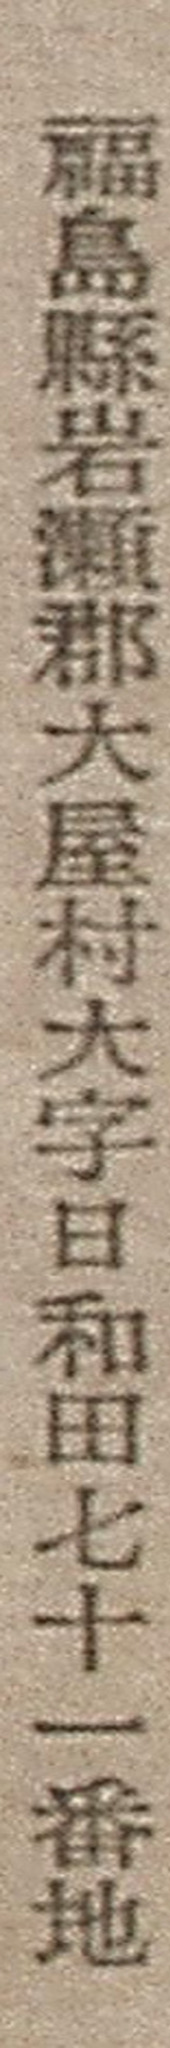福島県岩瀬郡大屋村大字日和田七十一番地
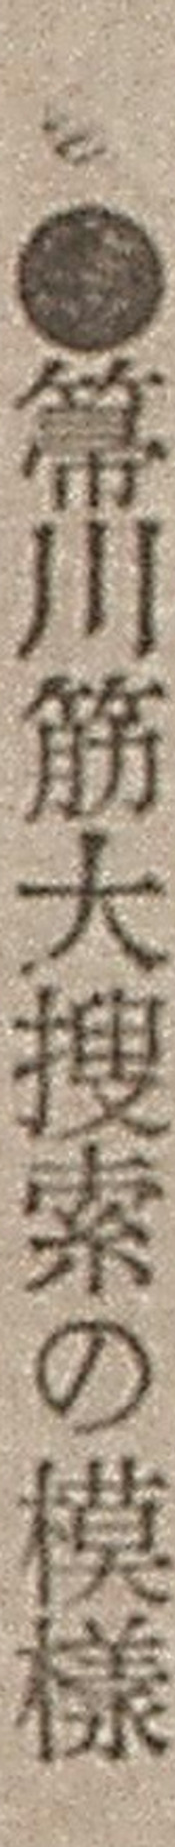●箒川筋大捜索の模様
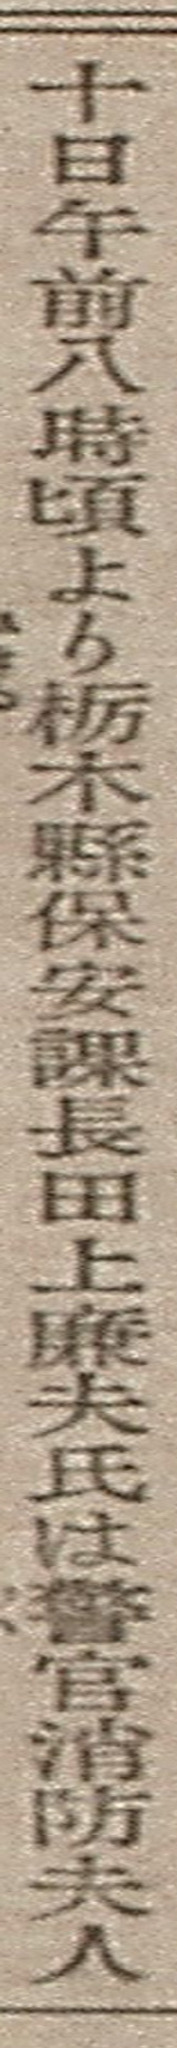十日午前八時頃より栃木県保安課長田上廉夫氏は警官消防夫人
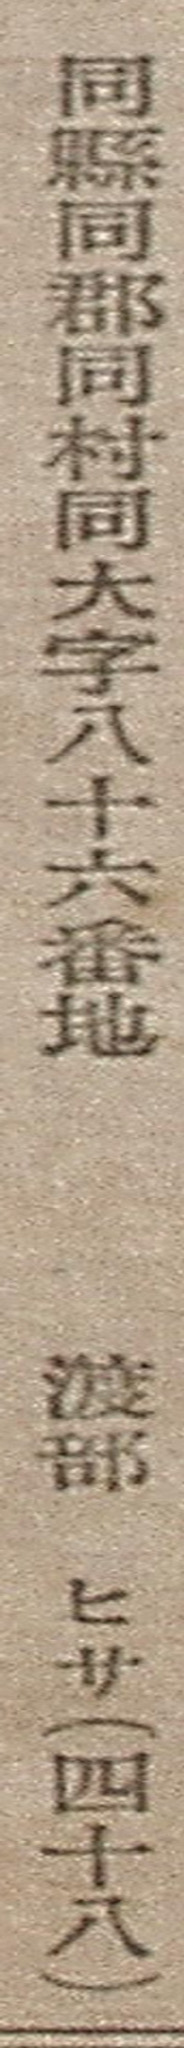同県同郡同村同大字八十六番地渡部ヒサ
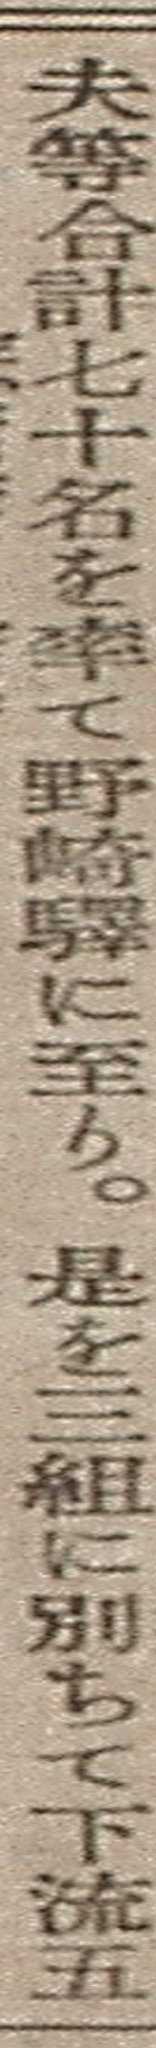夫等合計七十名を率て野崎駅に至り。是を三組に別ちて下流五
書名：風俗畫報臨時増刊第百九十九號　明治三十二年十月各地災害圖會（前編之續）
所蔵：東京大学地震研究所図書室 Earthquake Research Institute Library, The University of Tokyo, JAPAN
